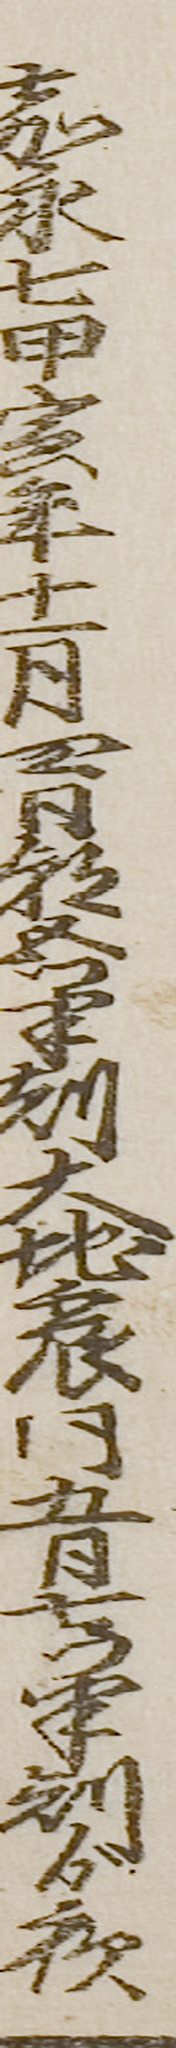嘉永七甲寅年十一月四日夜五ツ半刻大地震同五日七ツ半刻より夜
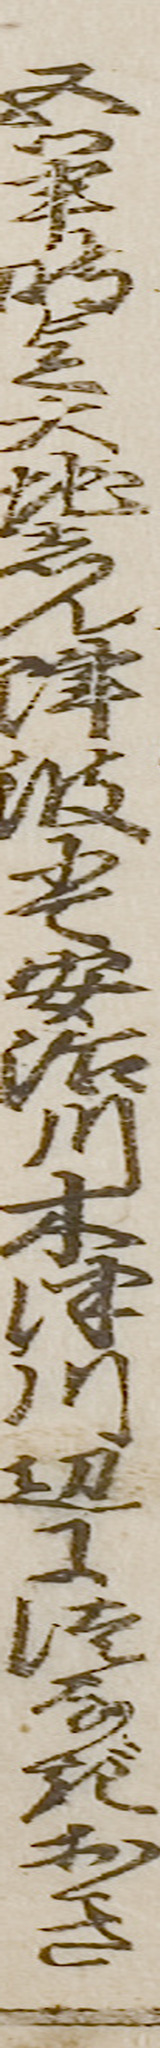五ツ半時迄大地しん津波にて安治川木津川辺につなぎおき
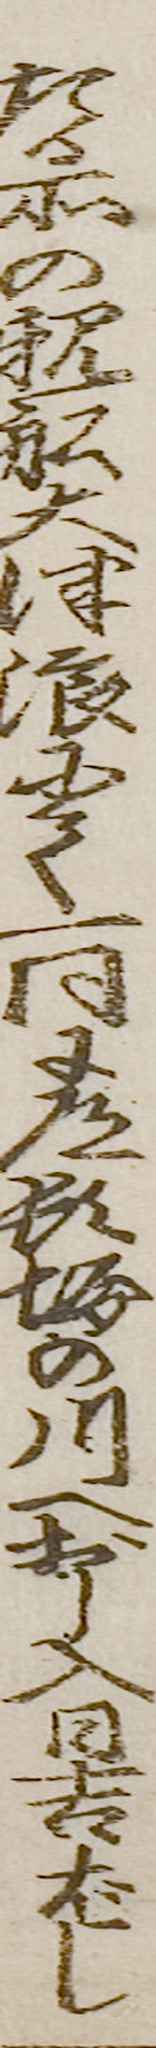たる所の親船大津波にて一同に道頓堀の川へおし入日吉ばし
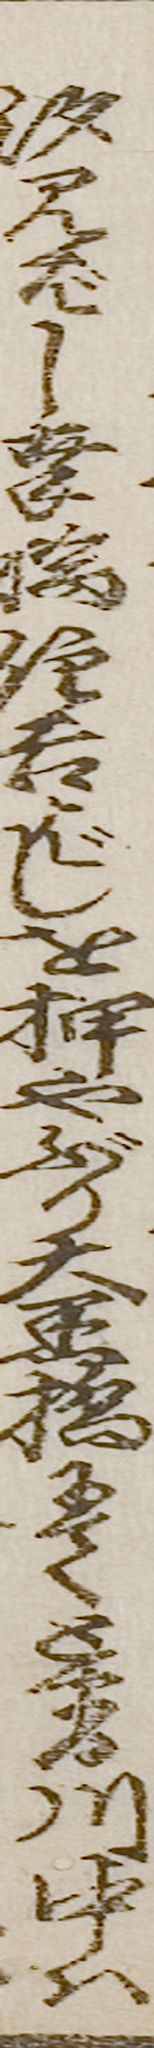汐見ばし幸橋住吉ばしを押やぶり大黒橋にてとまる川中は
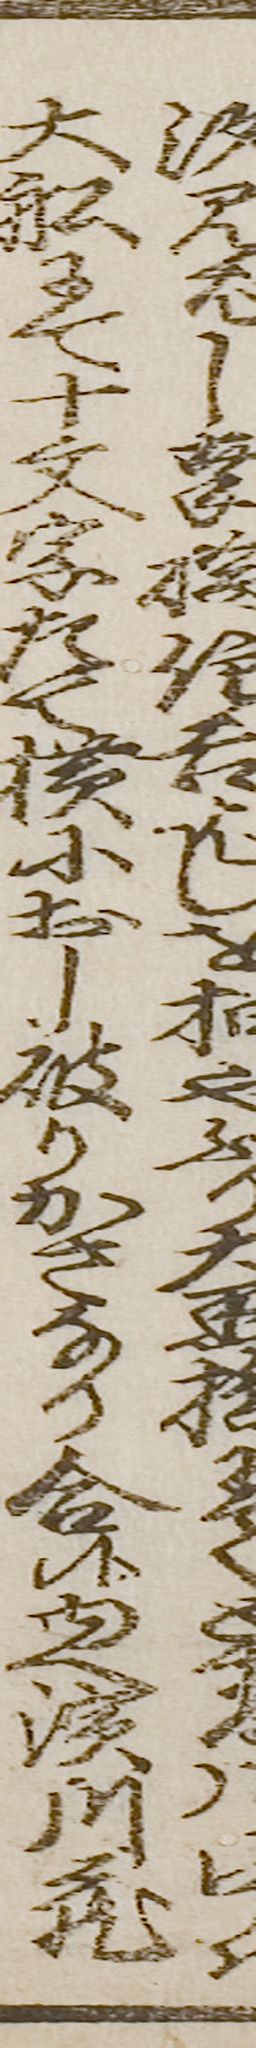大船にて十文字たて横におし破りかさなり合候ゆへ浜川蔵
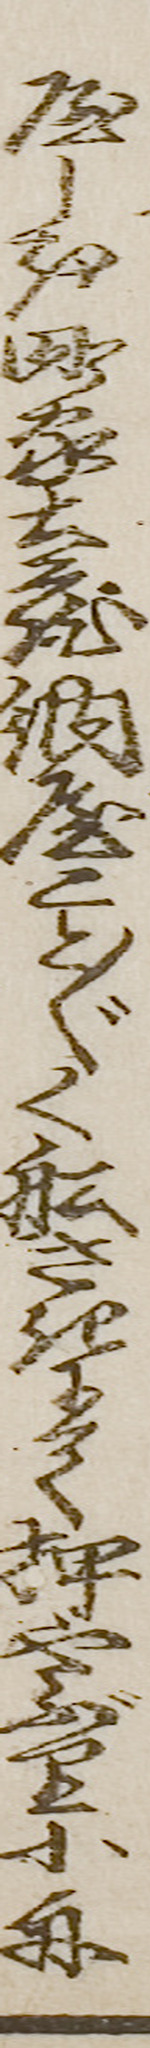屋しき町家大蔵納屋こと〴〵く船さきにて押やぶり小舟
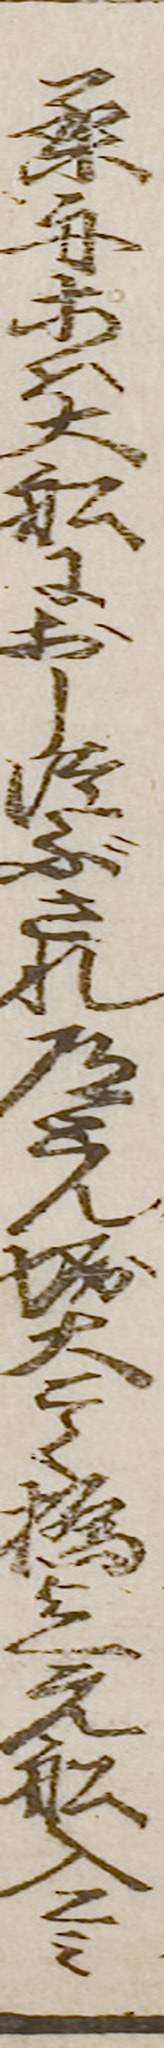茶舟等は大船におし潰ぶされ道とん堀大こく橋迄も船入こみ
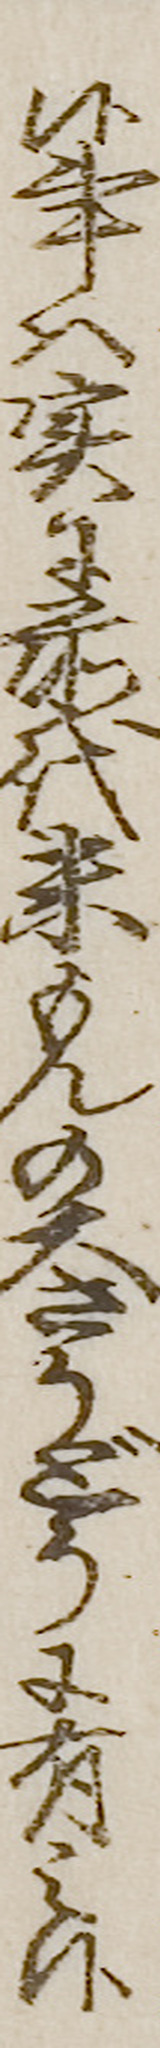候事は実に前代未もんの大さうどうに有て候
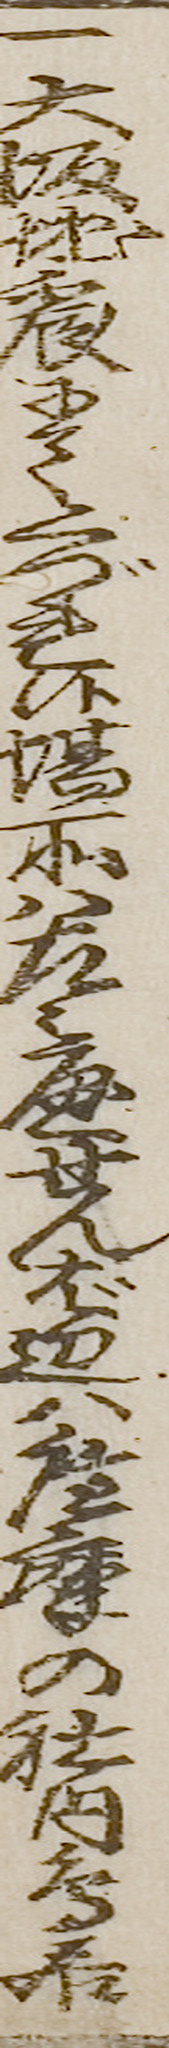一大坂地震にてくづれ候場所は左の通せんば辺は座摩の社内鳥居
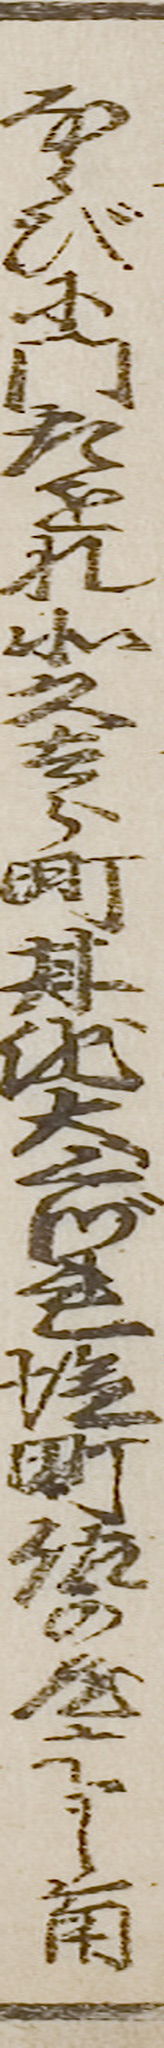ならびに門たをれ北久太郎町丼池大くづれ塩町佐の屋し角
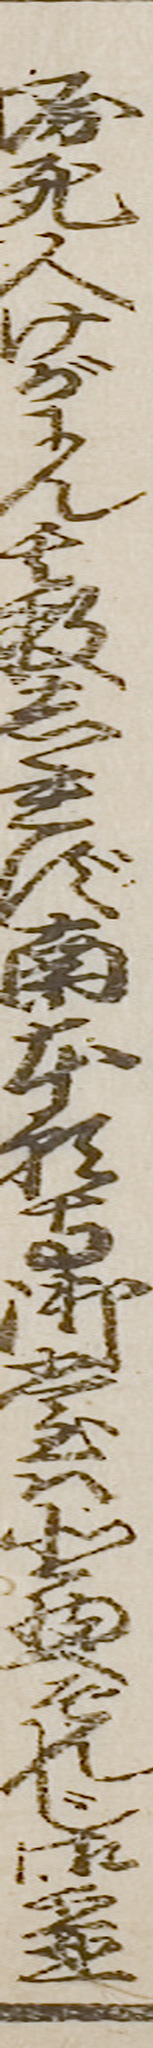堀死人けが人其数しれず南本願寺御堂は北西へそんじ御霊
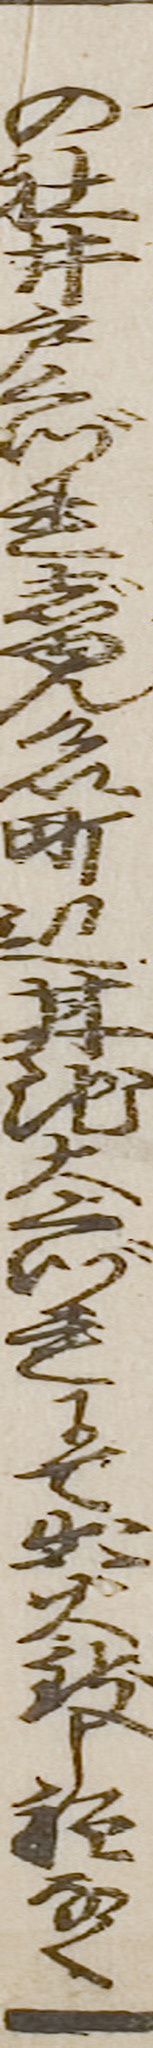の社井戸くづれじゆんけい町辺丼池大くづれにて出火致し程なく
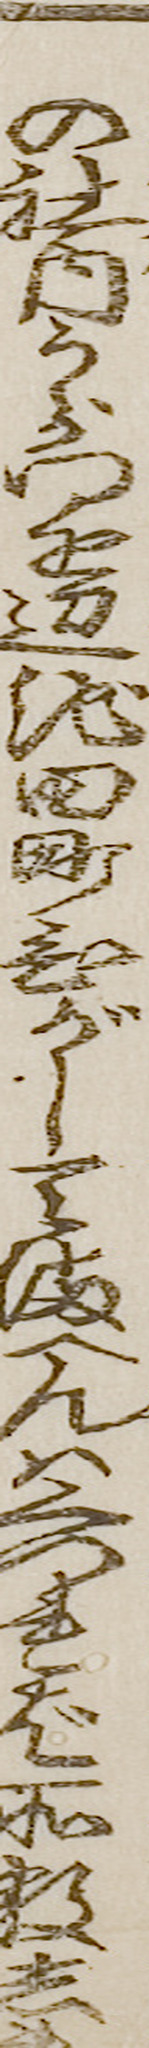の社内から門近辺池田町のひがし天満へんはくつれば所数しれ
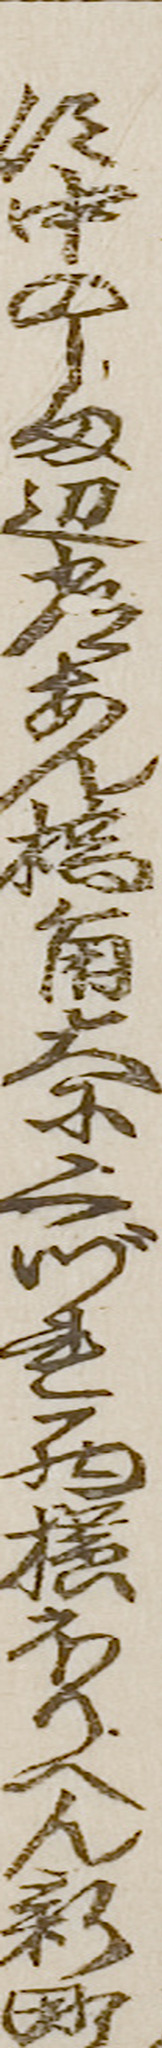す中のしま辺常あん橋角大にくづれ西横ほりへん新町遊女
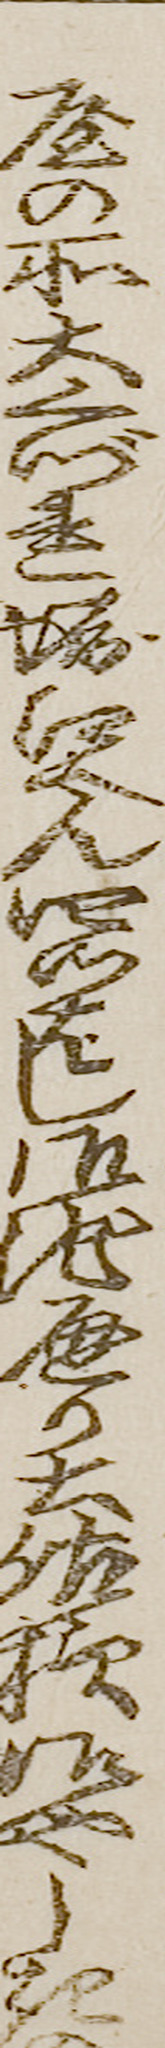屋の所大くづれ堀江へん四ツはし御池通り土佐様御やしきの堀
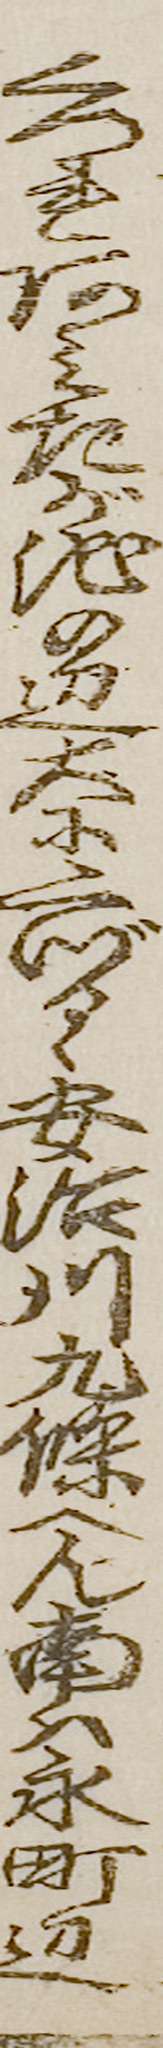くつれあみだが池の辺大にくづるゝ安治川九条へん南は永町辺
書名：大地震大津浪一口ばなし
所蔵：東京大学総合図書館 General Library in the University of Tokyo, JAPAN
